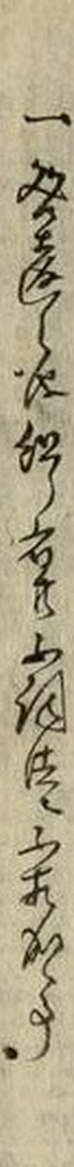一咎違之儀組之者不調法ニ不相成候事
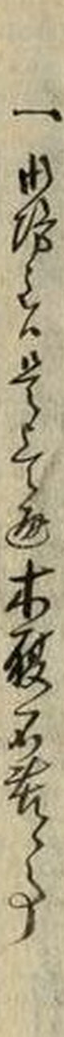一御坊主者是迄之通木履不苦候事
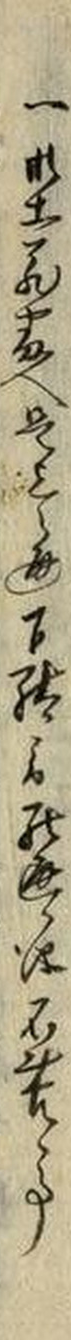一御土蔵番人是迄之通下駄ニ而罷通候儀不苦候事
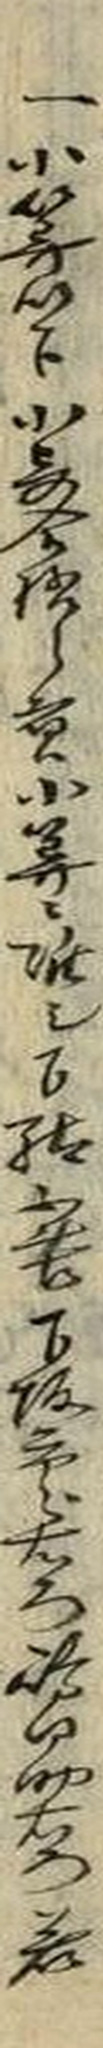一小算以下小寄合格之者ハ小算ニ准シ下駄不苦下坂市郎右衛門嶋田助右衛門若
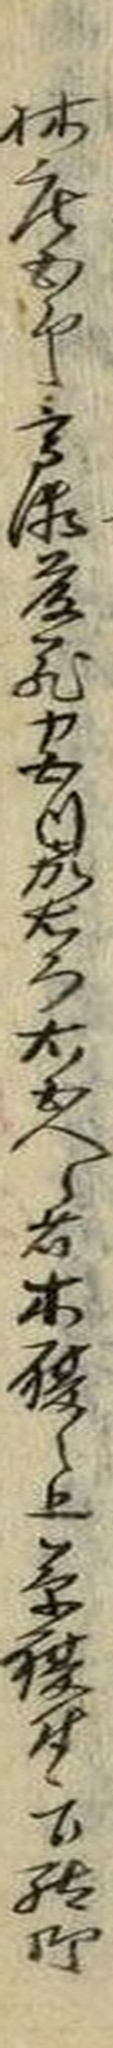林庄五郎高瀬藤蔵安川加右衛門右五人之者木履之上草履付候下駄御
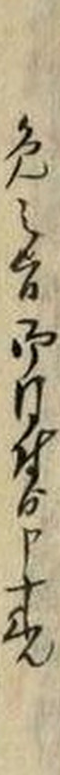免之旨御目付ゟ申来ル
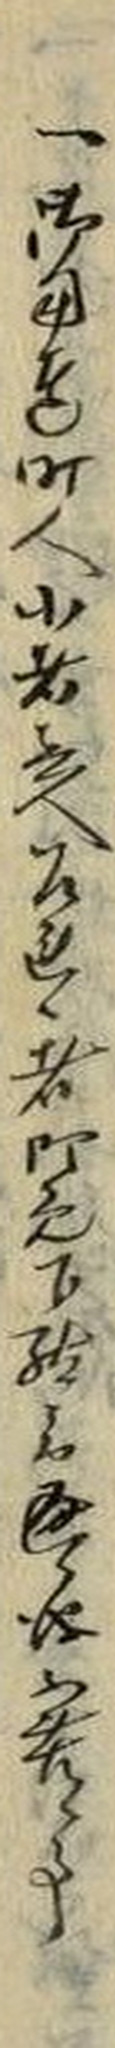一御用達町人小者壱人召連候者御免下駄ニ而通候儀不苦候事
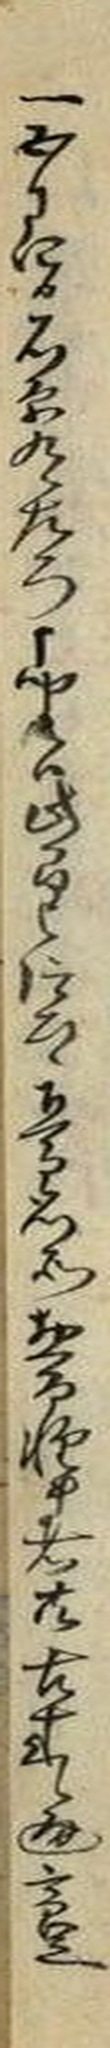一五月四日石原九郎左衛門申聞候ハ此間之仰出候下馬御門所惣而軽キ者共古来之通高足
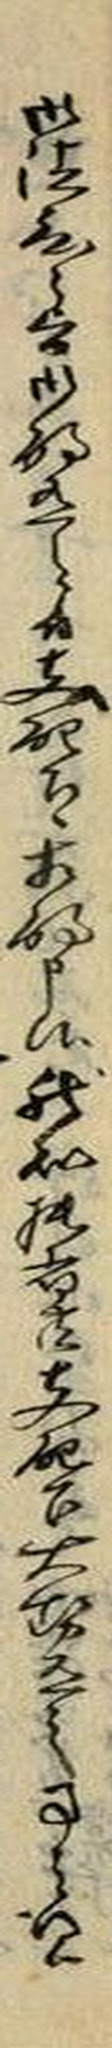御法度之旨御触有之候付支配下へ相触申候然処拙者共支配下大勢有之事ニ候得ハ
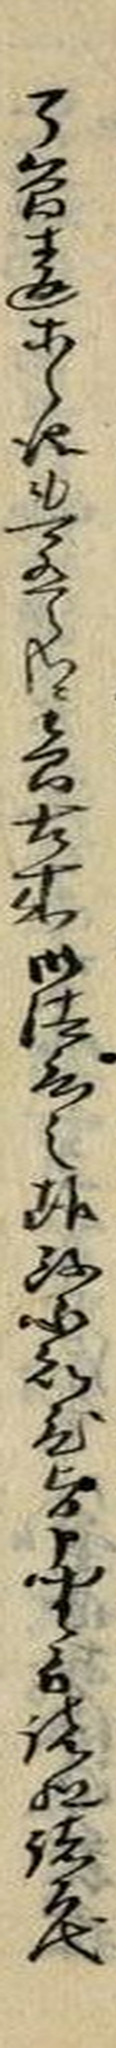了簡違等之儀も可有之哉ニ候間古来御法度之趣致承知度旨申聞候ニ付諸組諸下代
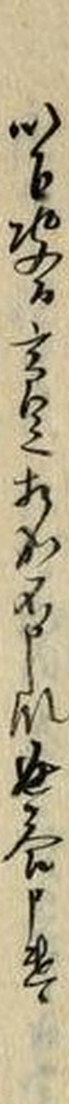以下決而高足相成不申段返答申遣候
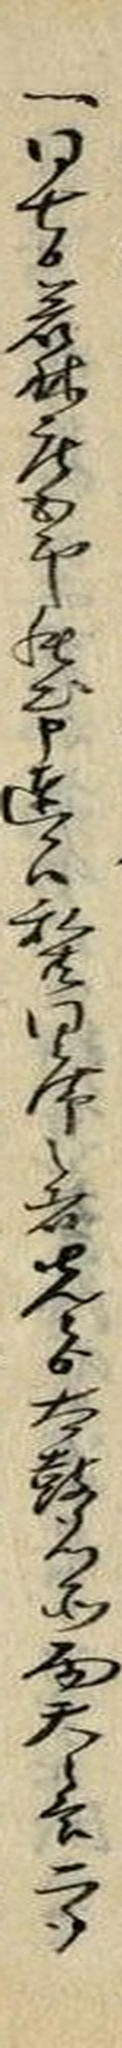一同七日若林庄五郎罷出申達候ハ私共同席之者先々ゟ太鼓御門所雨天之節二ツ
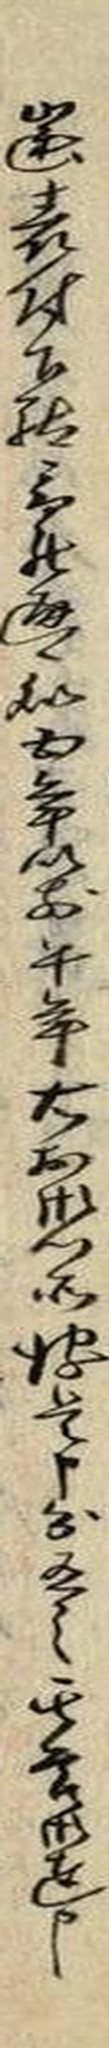歯表付下駄ニ而罷通候処五年以前午年右於御門所彼是申分有之其節御達申
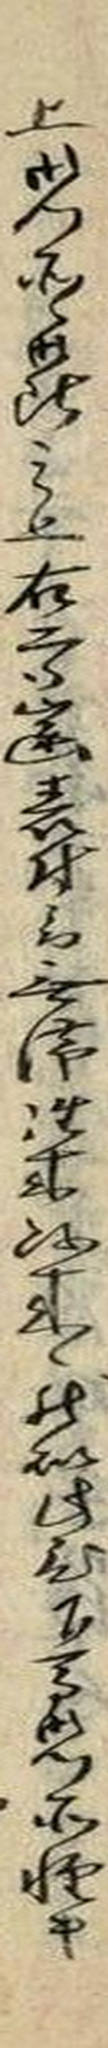上御門所へ御断之上右二ツ歯表付ニ而無滞往来致来候然処此度下馬御門所軽キ
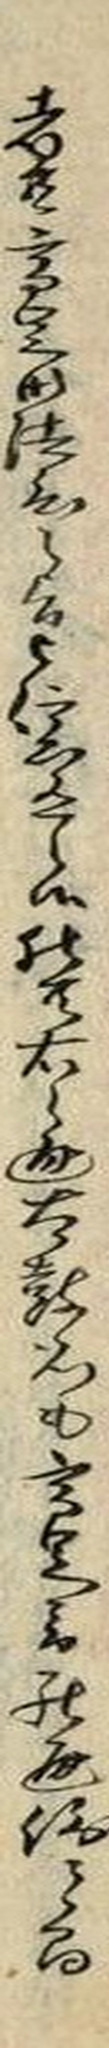者共高足御法度之旨被仰出有之候然共右之通太鼓御門も高足ニ而罷通儀ニ候間
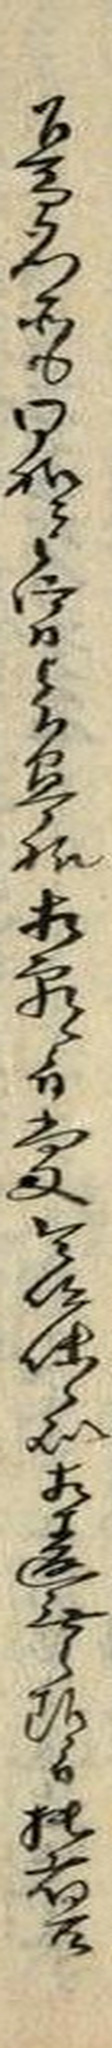下馬御門所も同様ニ被仰付被下置候様相願候ニ付尚又令吟味候処相違無之趣ニ付拙者共
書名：御門御櫓之部
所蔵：福井県文書館 Fukui Prefectural Archives
